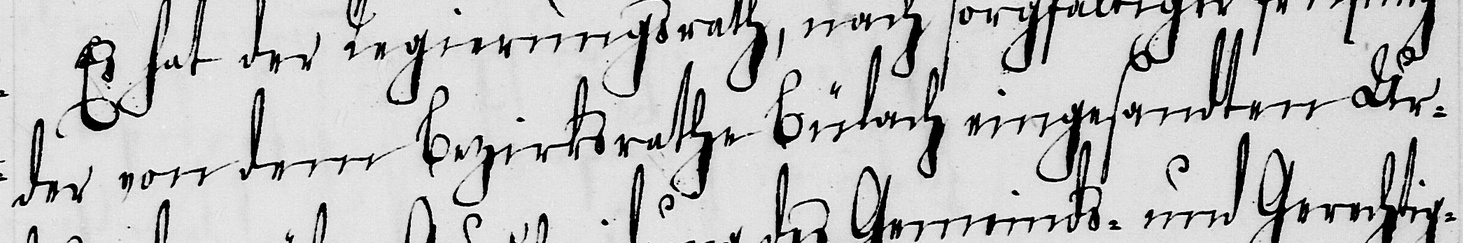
der von dem Bezirksrathe Bülach eingesandten Ur¬
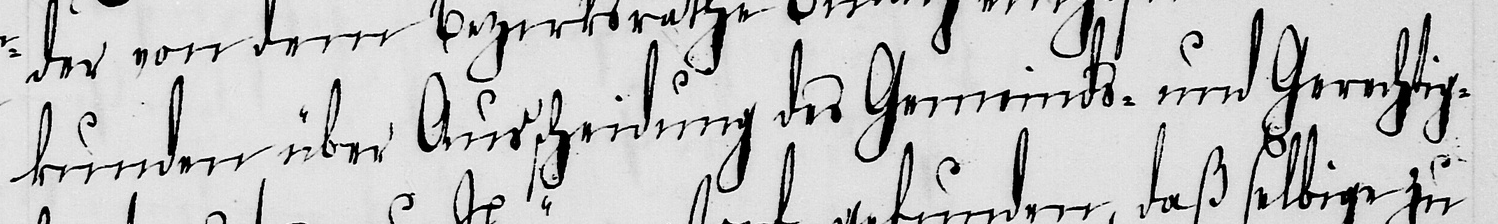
kunden über Ausscheidung des Gemeinds- und Gerechti¬
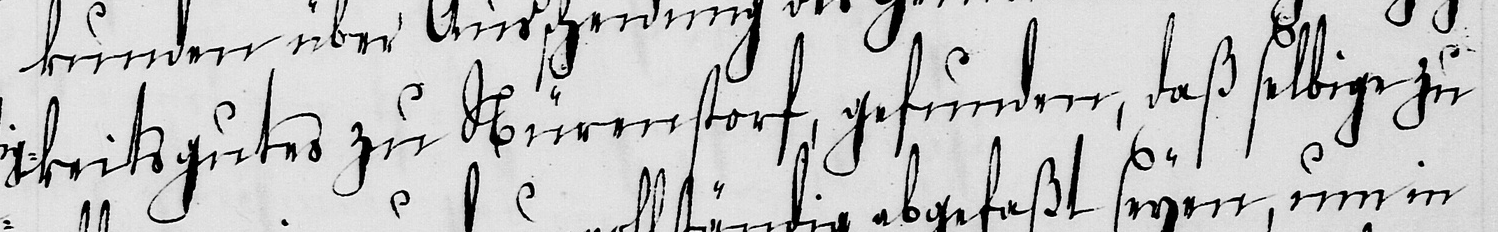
gkeitsgutes zu Nürenstorf, gefunden, daß selbige zu
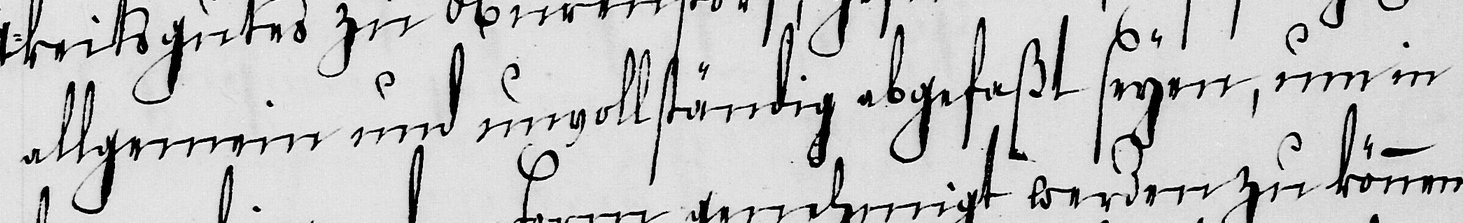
allgemein und unvollständig abgefaßt seyen, um in
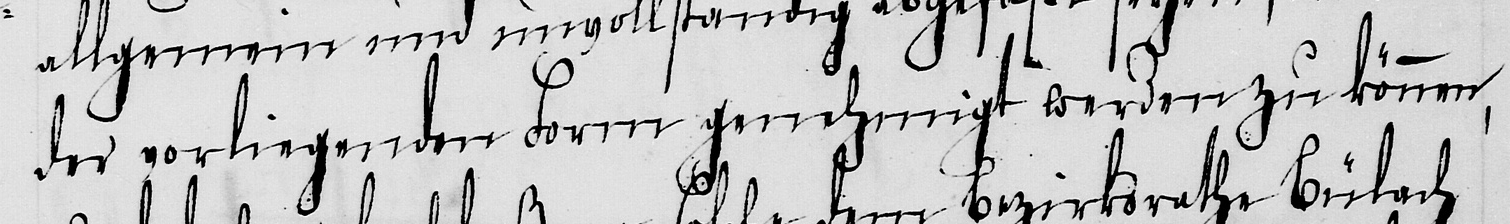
der vorliegenden Form genehmigt werden zu können,
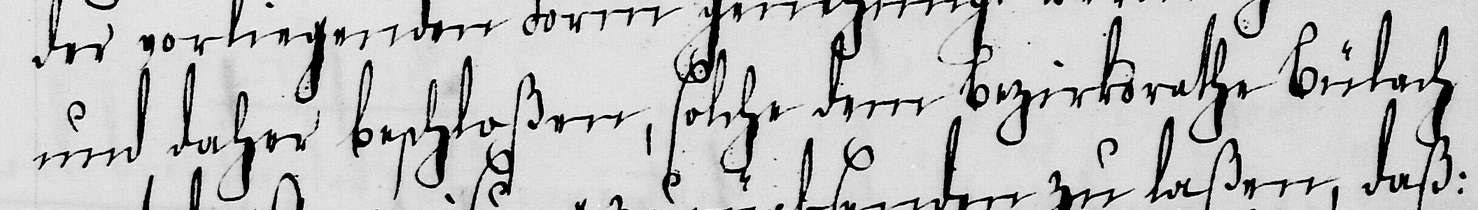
und daher beschloßen, solche dem Bezirksrathe Bülach
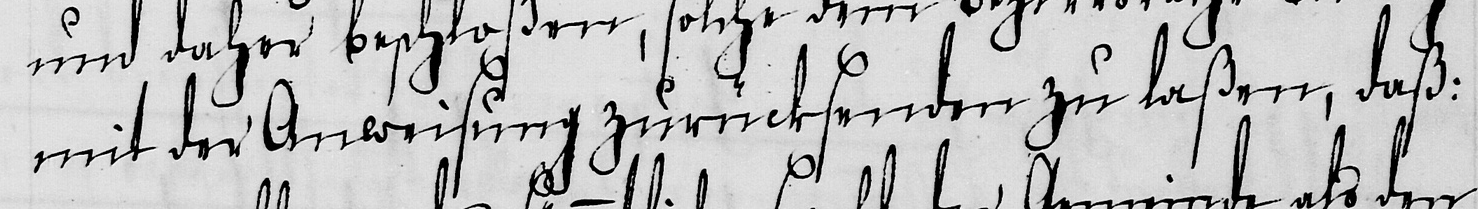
mit der Anweisung zurücksenden zu laßen, daß:
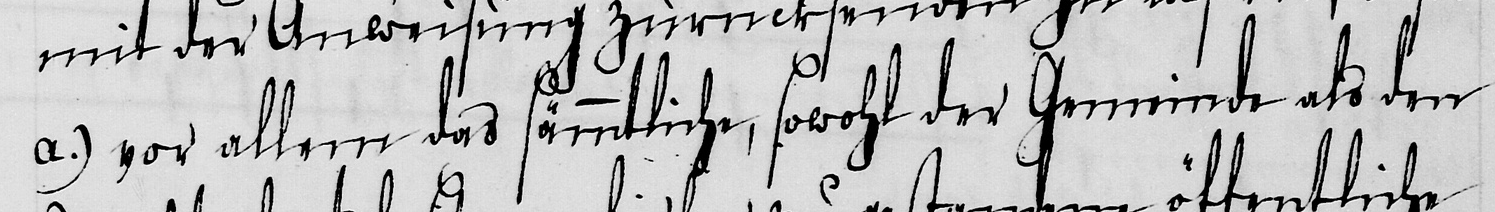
a.) vor allem das sämmtliche, sowohl der Gemeinde als den
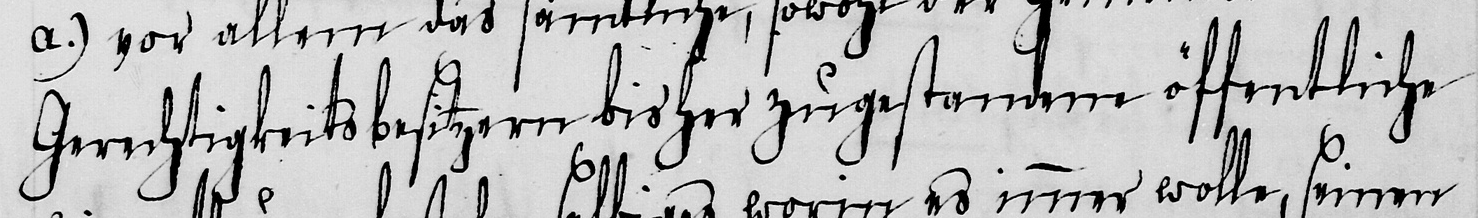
Gerechtigkeitsbesitzern bisher zugestandene öffentliche
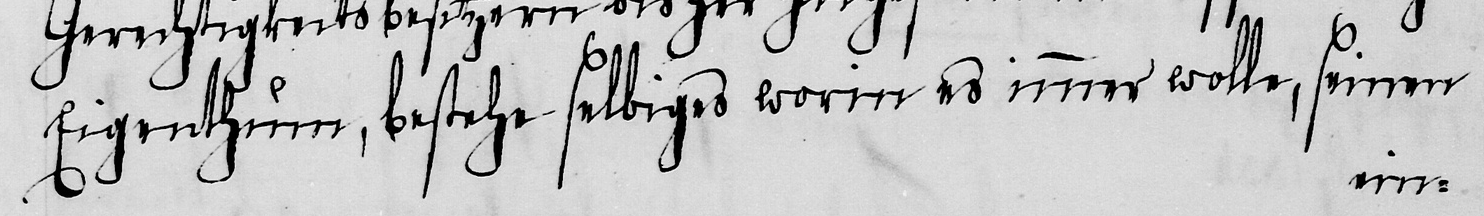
Eigenthum, bestehe selbiges worin es immer wolle, seinen
